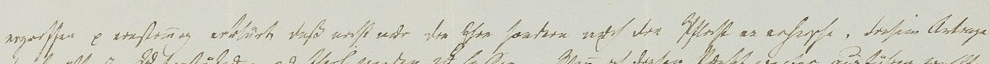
ergriffen & einstimmig erklärt, daß nicht nur die Ehre sondern auch die Pflicht es erheische, diesem Antrage
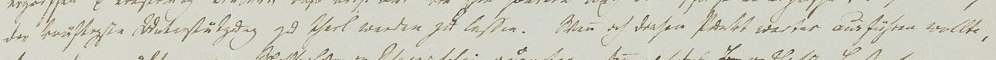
die kräftigste Unterstüzung zu Theil werden zu lassen. Wenn ich diesen Punkt weiter ausführen wollte,
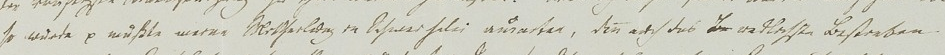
so würde & müßte meine Mittheilung in Schmeichelei ausarten, denn auch das redlichste Bestreben
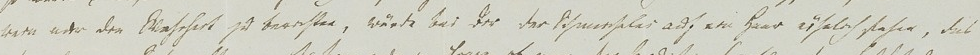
rein nur die Wahrheit zu berichten, würde bei Dir der Schmeichelei auf ein Haar ähnlich sehen, das
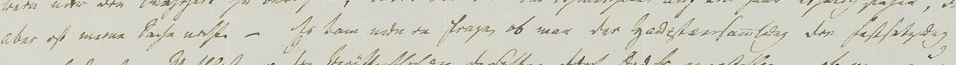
aber ist meine Sache nicht. – Es kam nun in Frage, ob man der Hauptversammlung die Festsetzung
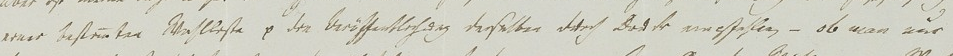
einer bestimmten Wahlliste & die Veröffentlichung derselben durch Druck empfehlen – ob man nur
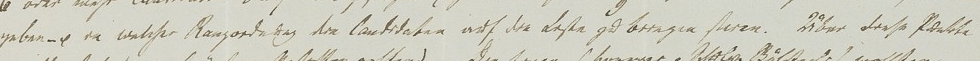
geben – & in welcher Rangordnung die Candidaten auf die Liste zu bringen seien. Über diese Punkte
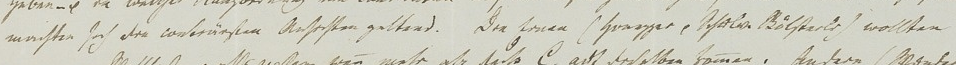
machten sich die conträrsten Ansichten geltend. Die Einen (Honegger & Schulv. Bölsterli) wollten
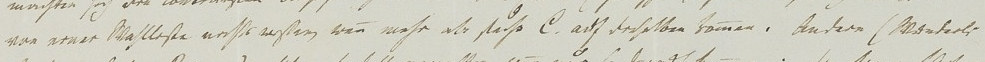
von einer Wahlliste nichts wissen, wenn mehr als sechs C. auf dieselbe kommen. Andere (Wunderli
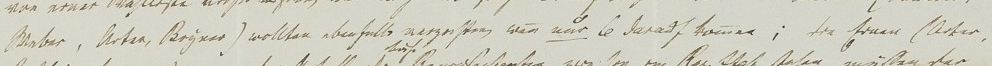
Weber, Arter, Bryner ) wollten ebenfalls verzichten, wenn nur 6 darauf kommen; die Einen (Arter,
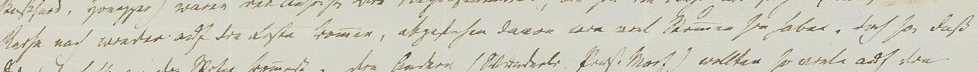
Reihe nach wieder auf die Liste kommen, abgesehen davon wie viel Stimmen sie haben, doch so, daß
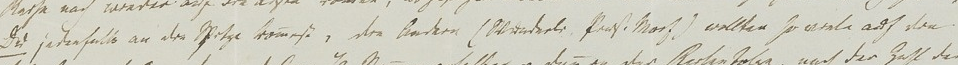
Du jedenfalls an die Spitze komme, die Andern (Wunderli, Präs. Morf) wollten so viele auf die
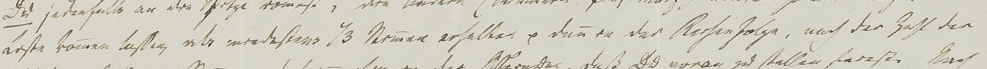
Liste kommen lassen, als mindestens 73 Stimmen erhalten & dann in in der Reihenfolge, nach der Zahl der
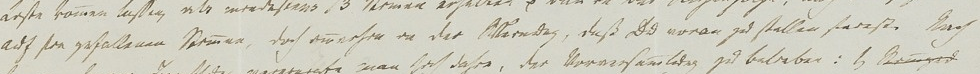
auf sie gefallenen Stimmen, doch immerhin in der Meinung, daß Du voran zu stellen seiest. Nach
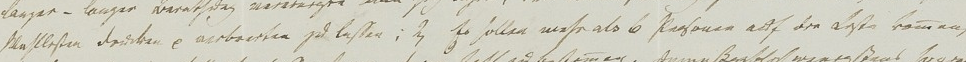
Wahllisten drucken & verbreiten zu lassen; 2, Es sollen mehr als 6 Personen auf die Liste kommen,
